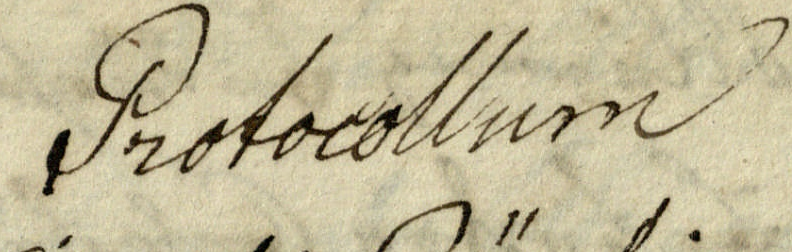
Protocollum
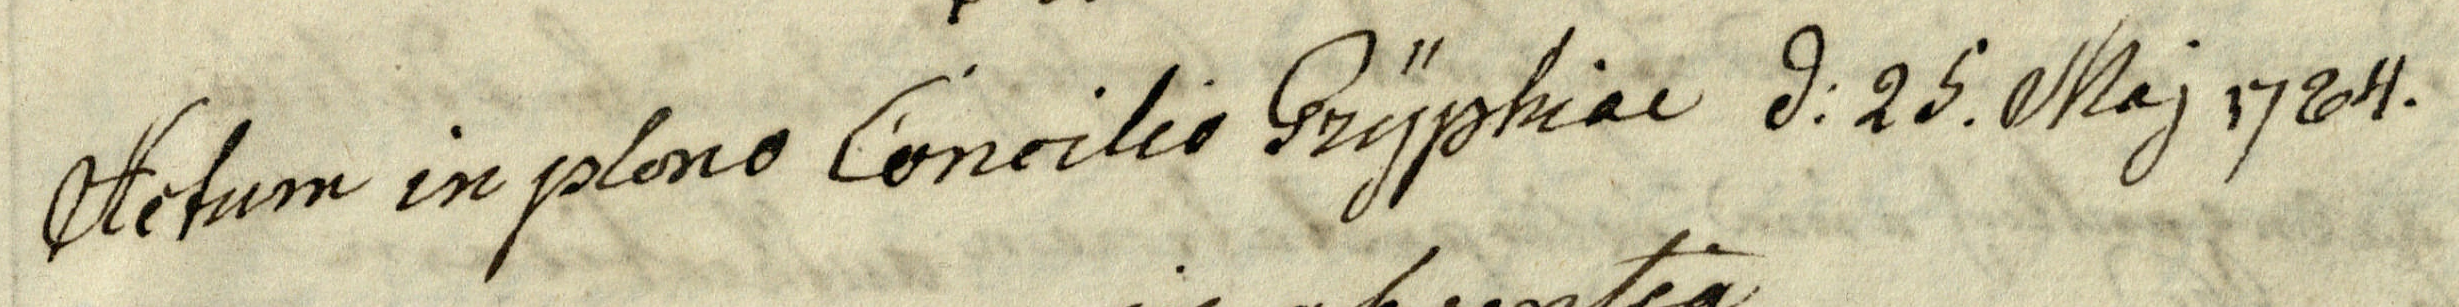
Actum in pleno Concilio Grÿphiae d. 25. Maj 1784.
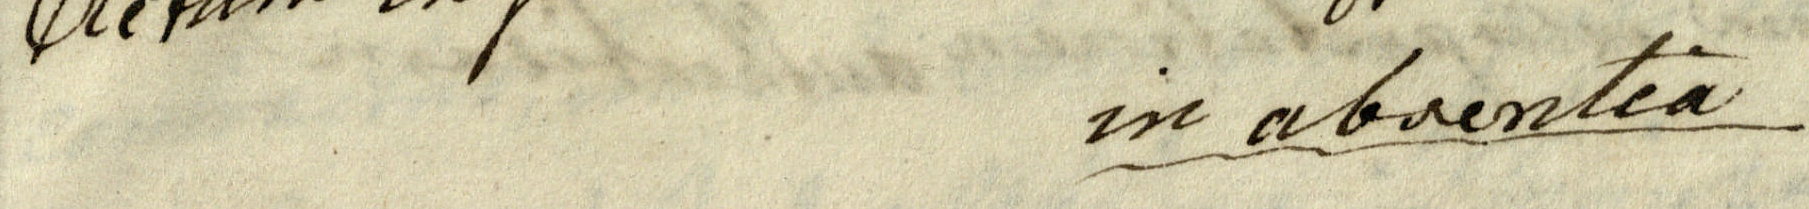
in absentia
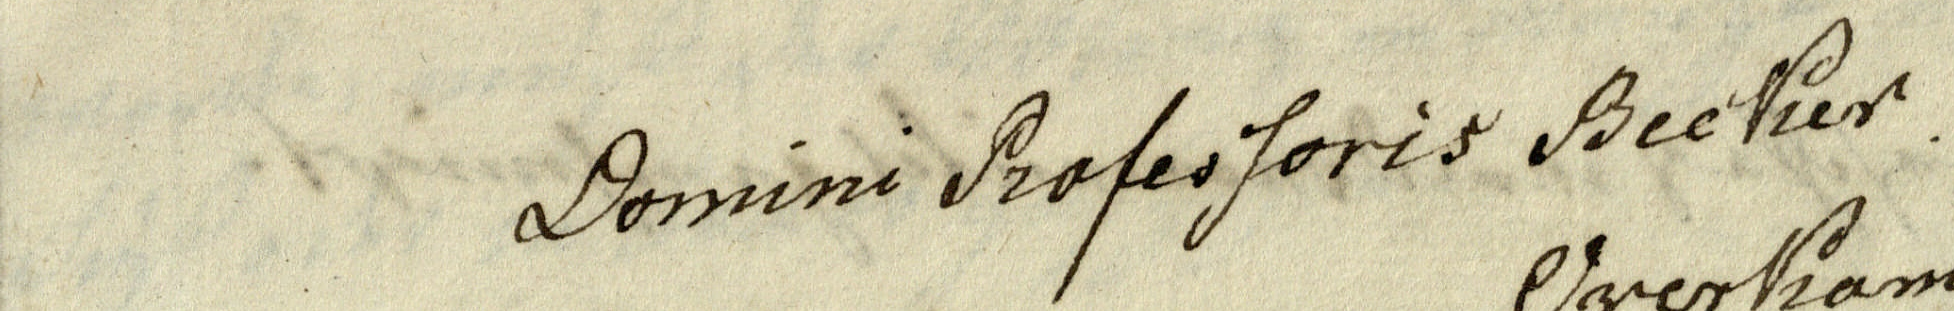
Domini Professoris Becker.
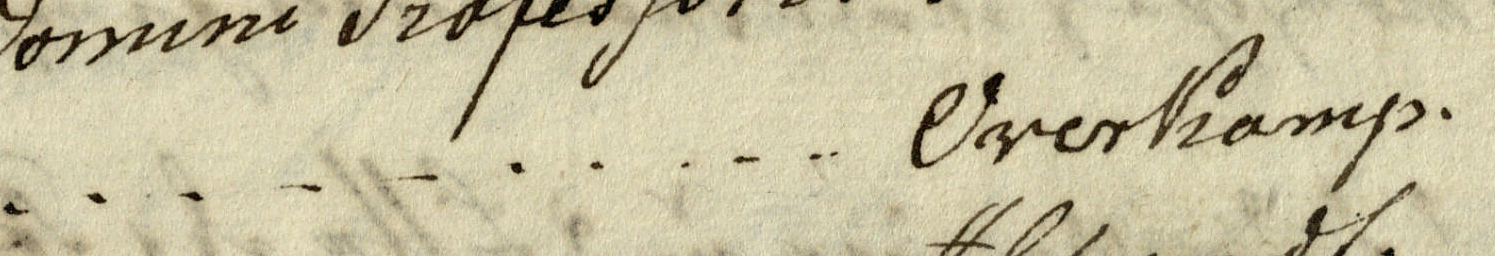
Overkamp.
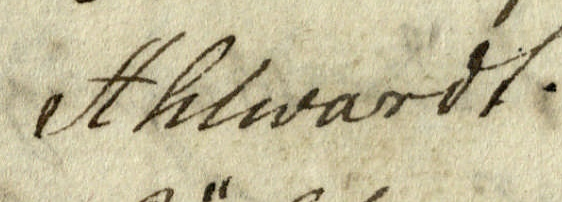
Ahlwardt.
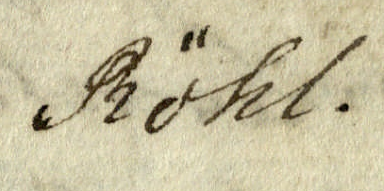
Röhl.
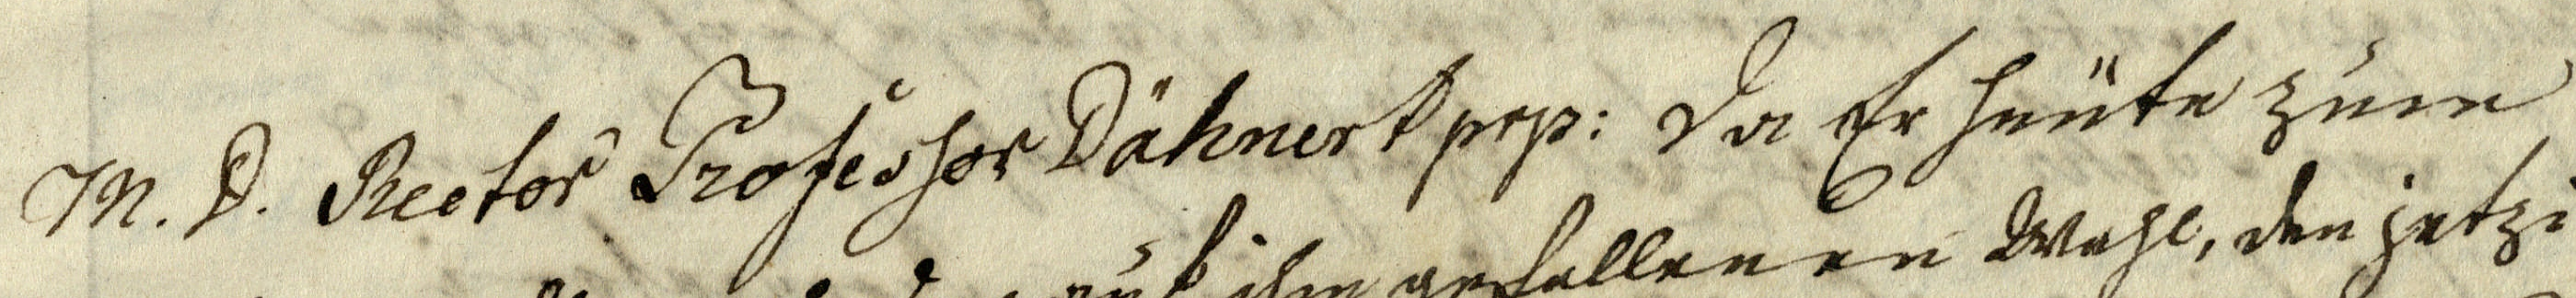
M. D. Rector Professor Dähnert prp. Da Er heute zum
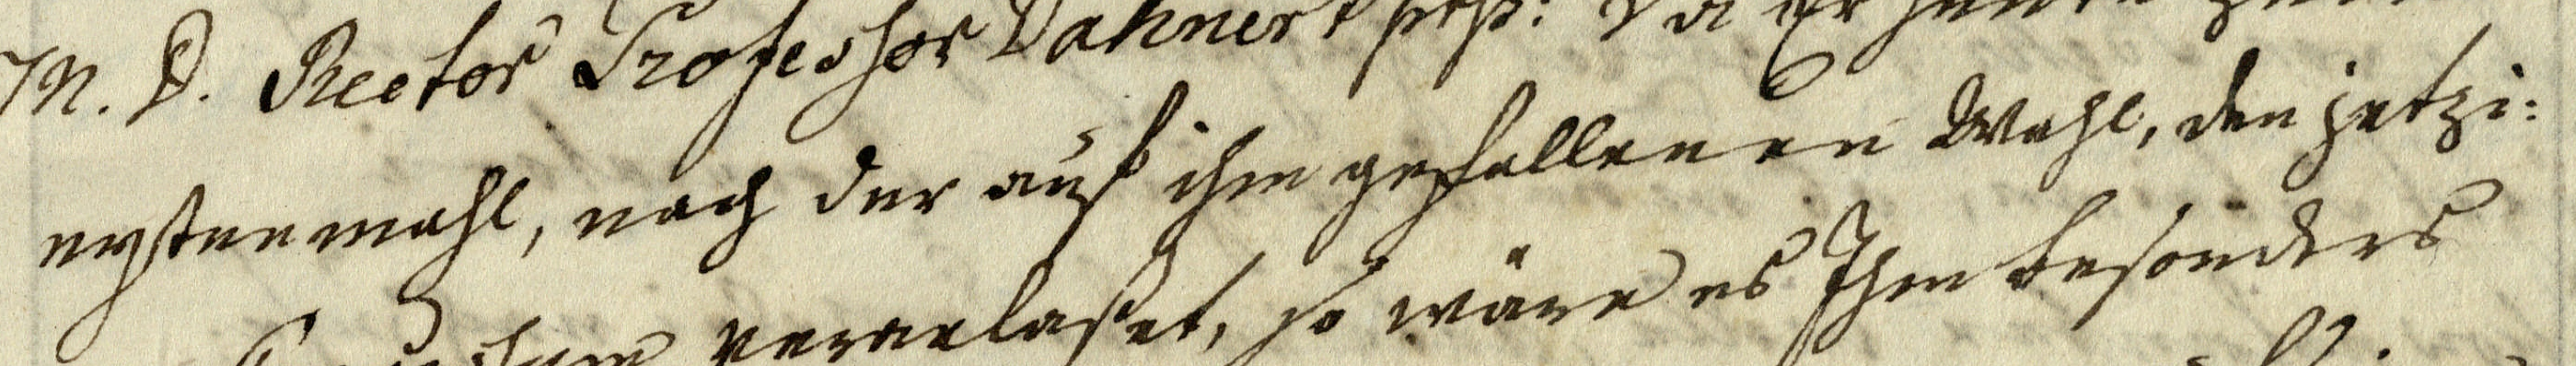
erstenmahl, nach der auf ihm gefallenen Wahl, den jetzi¬
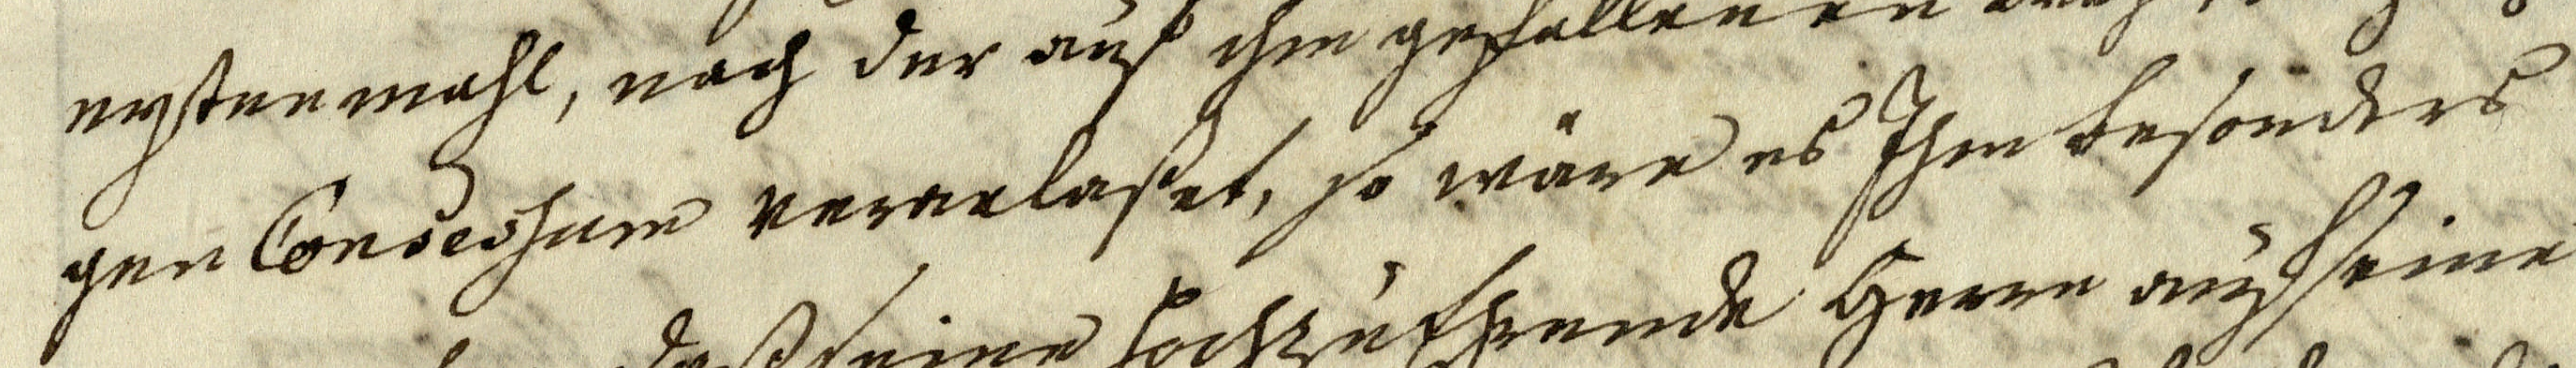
gen Cosessum veranlaßet, so wäre es Ihm besonders
